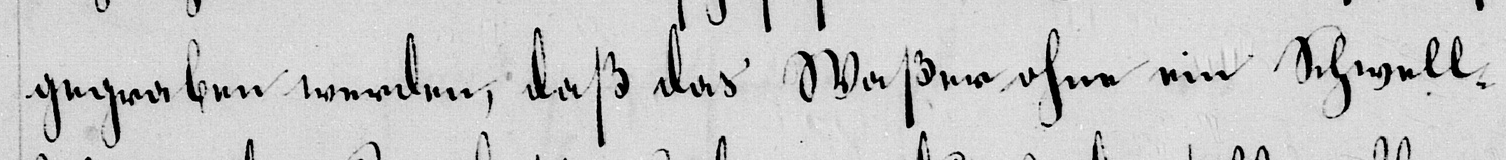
gegraben werden, daß das Waßer ohne ein Schwell¬
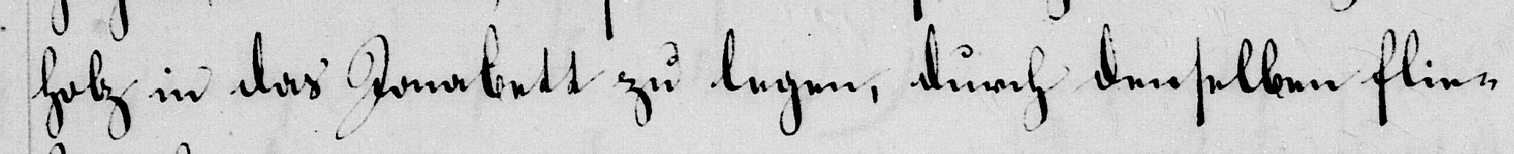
holz in das Jonabett zu legen, durch denselben flie¬
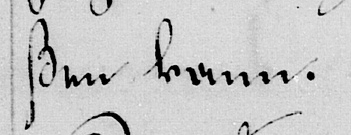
ßen kann.
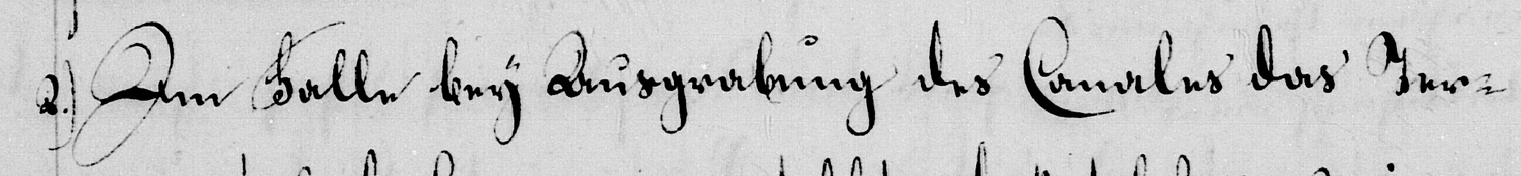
2.) Im Falle bey Ausgrabung des Canales das Ter¬
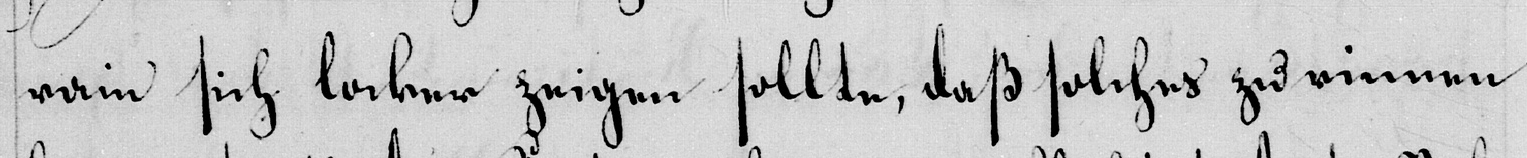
rain sich locker zeigen sollte, daß solches zu rinnen
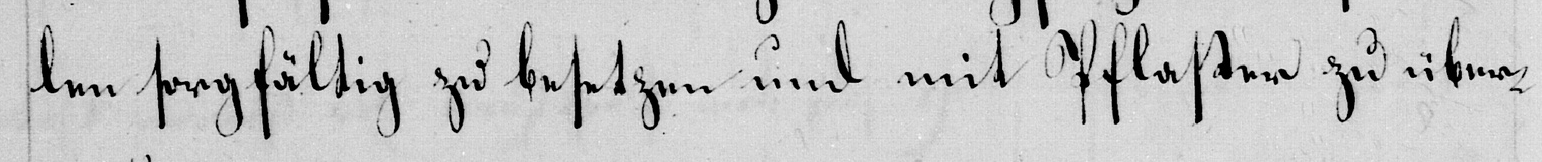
len sorgfältig zu besetzen und mit Pflaster zu über¬
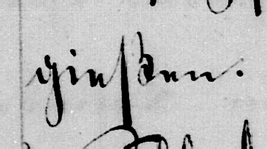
gießen.
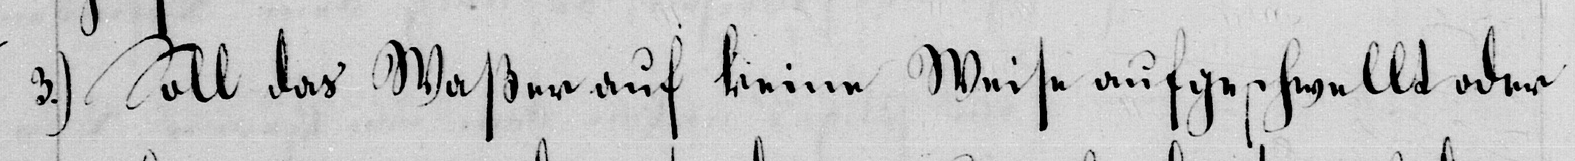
3.) Soll das Waßer auf keine Weise aufgeschwellt oder
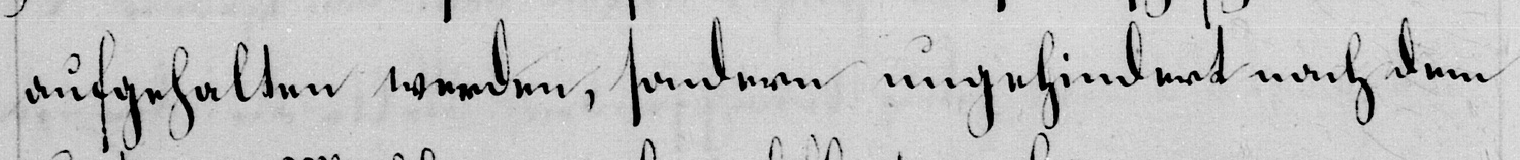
aufgehalten werden, sondern ungehindert nach dem
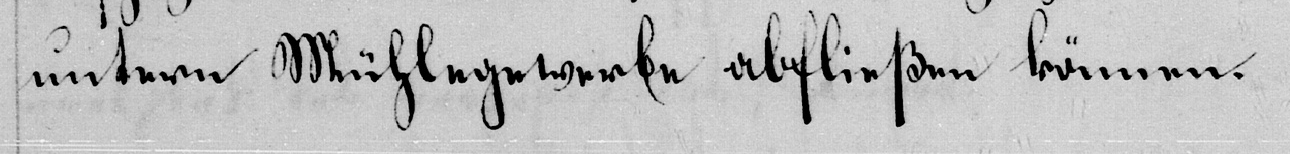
untern Mühlegewerbe abfließen können.
